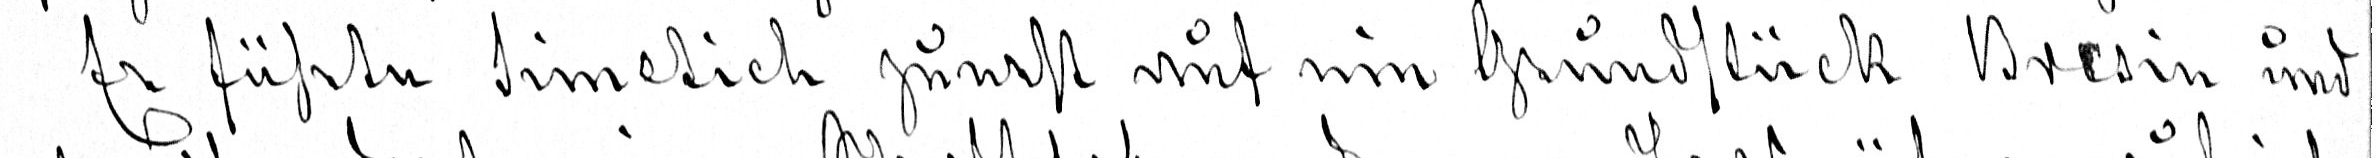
Er führte Simetich zuerst auf ein Grundstück Bresin und
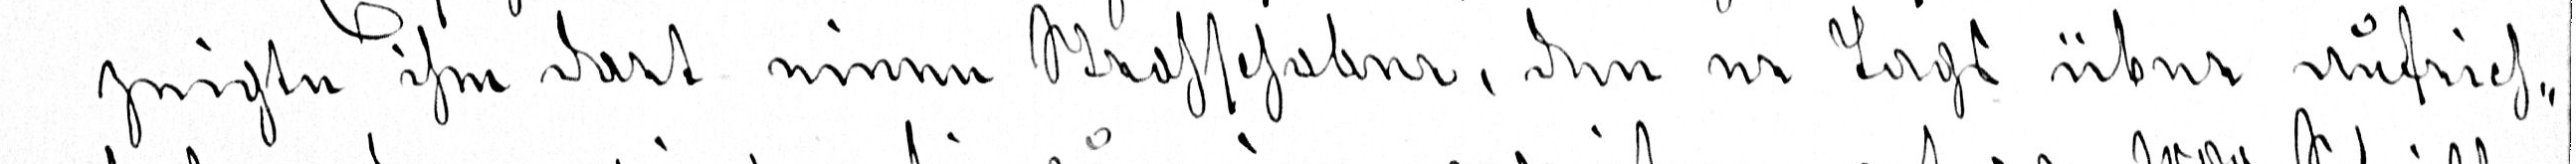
zeigte ihm dort einen Strohschober, den er Tags über aufrich¬
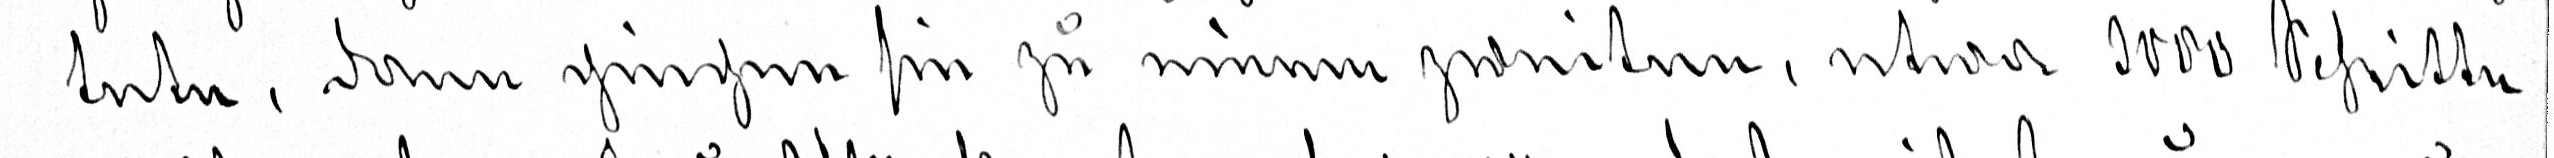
tete, dann gingen sie zu einem zweiten, etwa 3000 Schritte
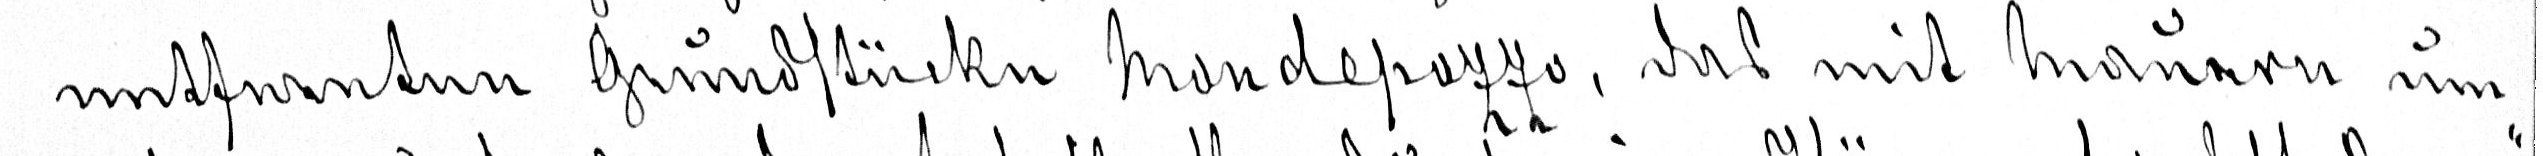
entfernten Grundstücke Mondepozzo, das mit Mauern um¬
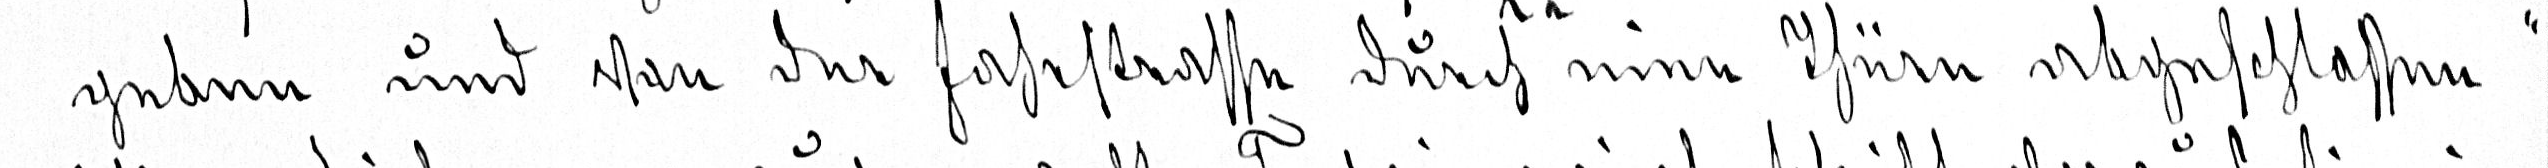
geben und von der Fahrstrasse durch eine Thüre abgeschlossen
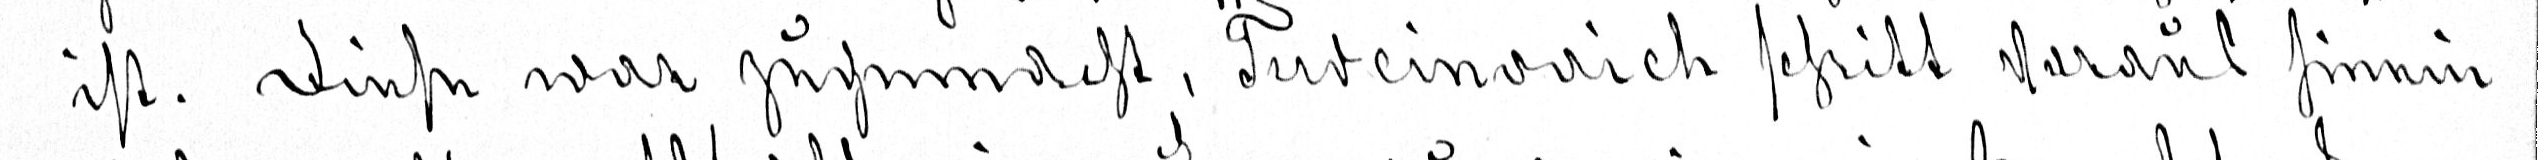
ist. Diese war zugemacht, Turcinovich schritt voraus hinein
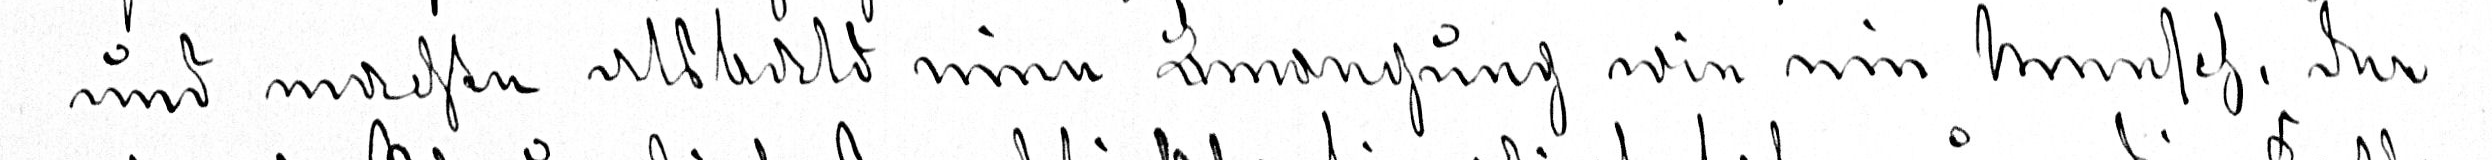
und machte alsbald eine Bewegung wie ein Mensch, der
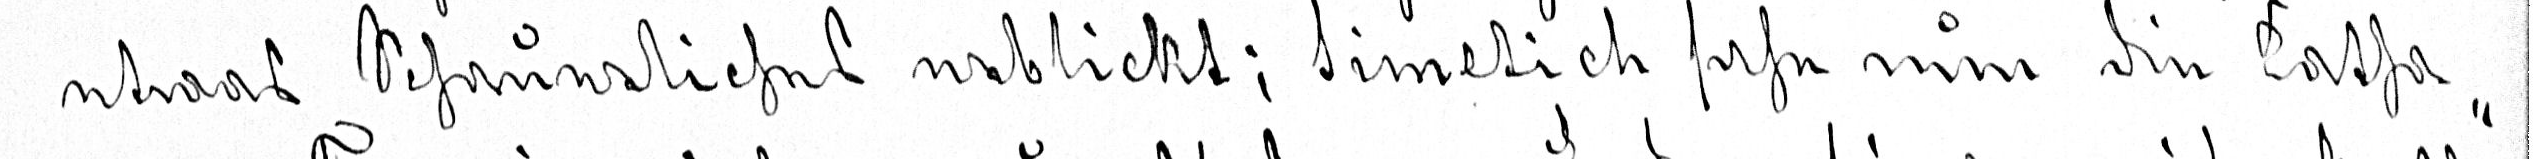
etwas Schauerliches erblickt; Simetich sahen nun die Katha¬
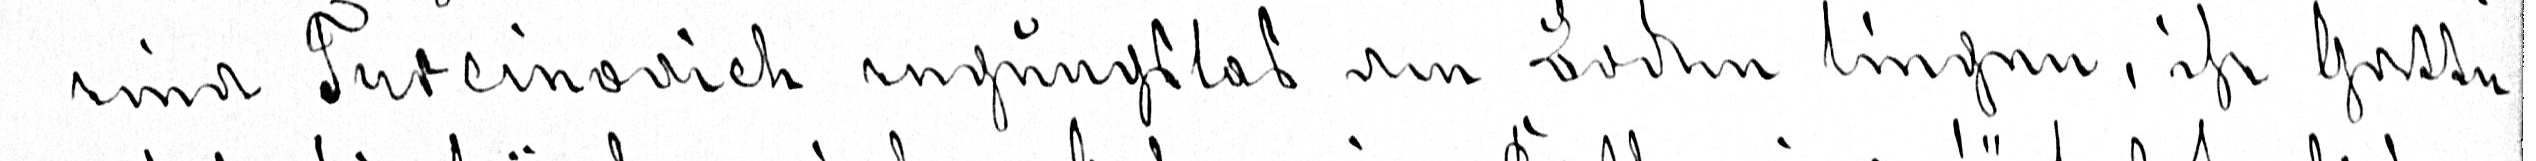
rina Turcinovichregungslos am Boden liegen, ihr Gatte
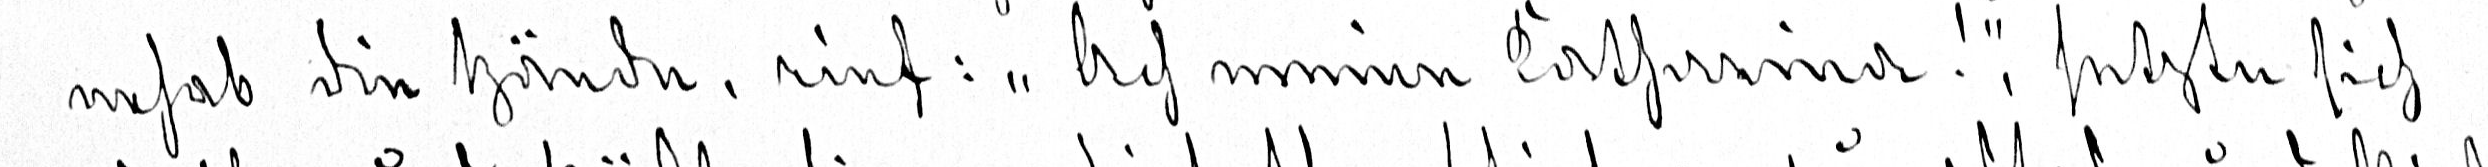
erhob die Hände, rief: „Ach meine Katharina!“, setzte sich
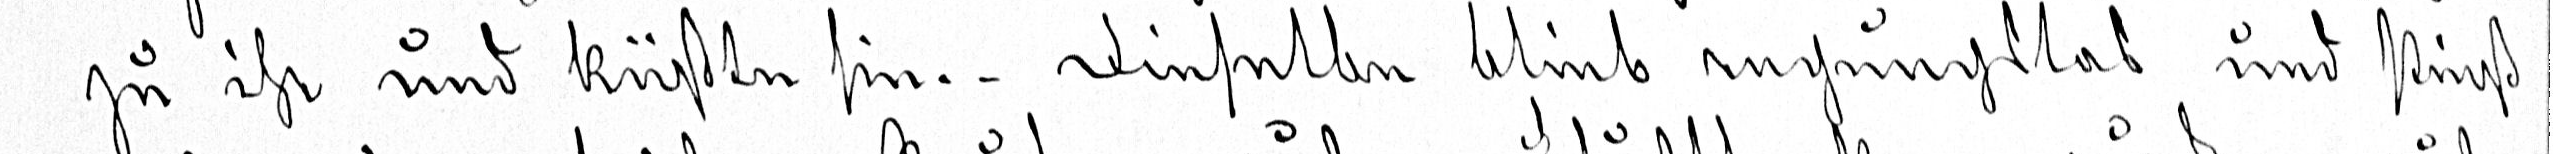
zu ihr und küßte sie.- Dieselbe blieb regungslos und stieß
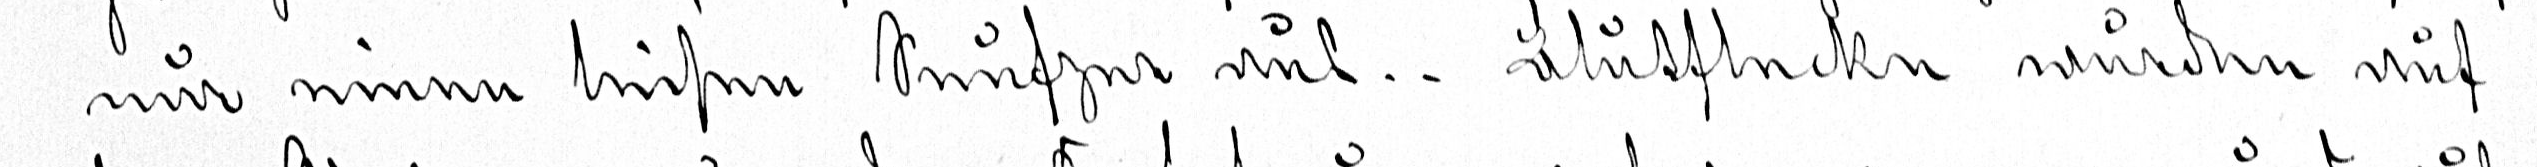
nur einen leisen Seufzer aus.- Blutflecke wurden auf
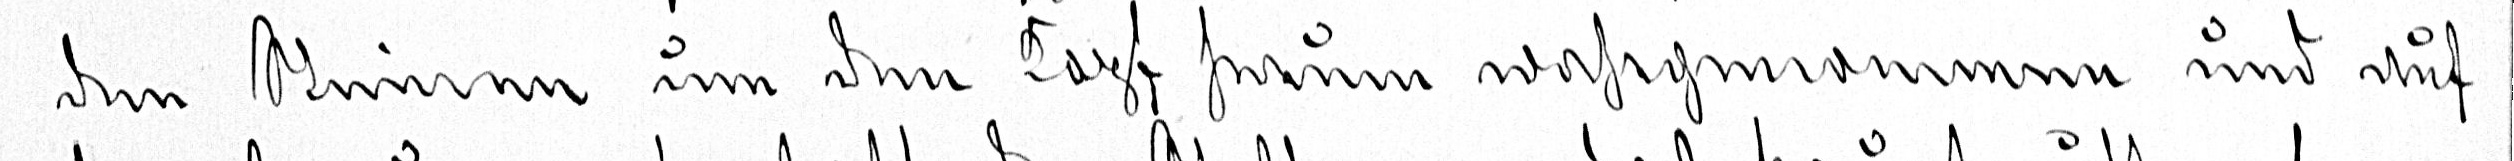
den Steinen um den Kopf herum wahrgenommen und auf
